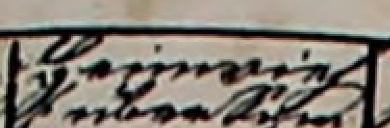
Heimvieh
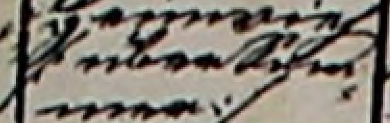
/: über Sum„
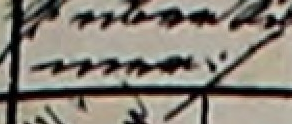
mer :/
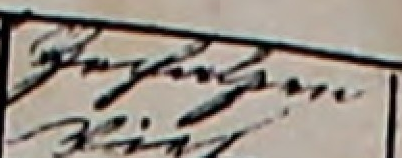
Hochatzen„
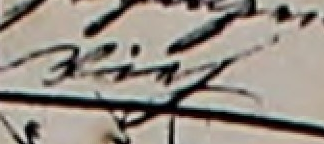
vieh
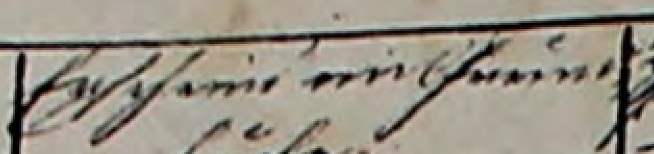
Erscheint im Grund„
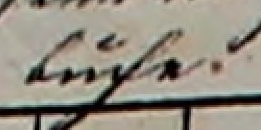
buche.
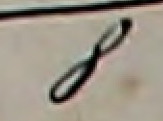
8
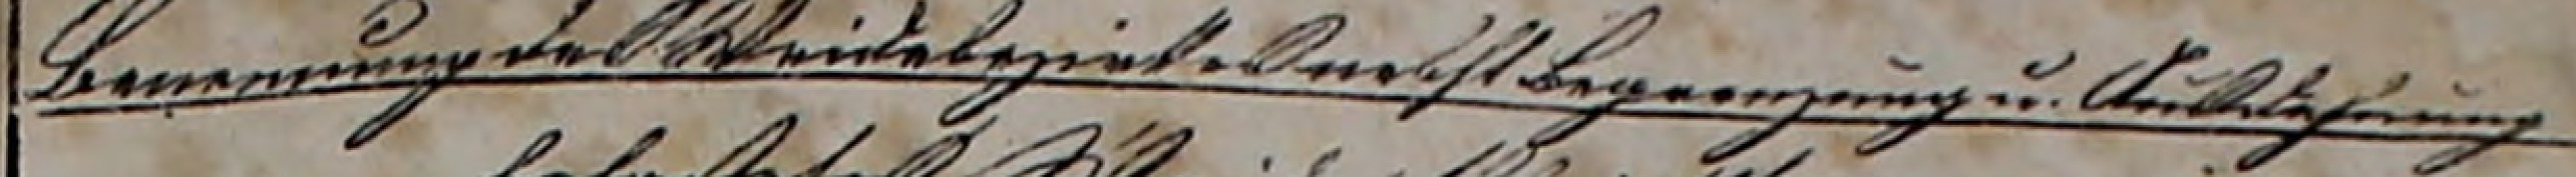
Benennung des Weidebezirkes nebst Begrenzung u. Ausdehnung
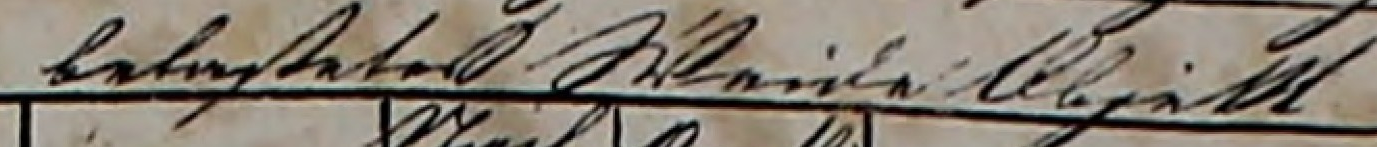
belastetes Weide Objekt
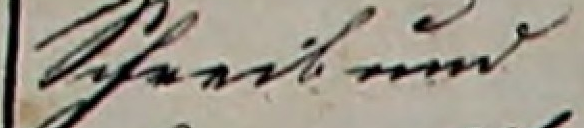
Schreib und
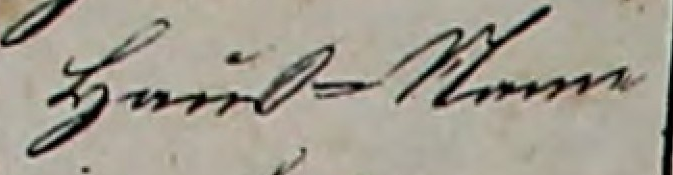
Haus = Name
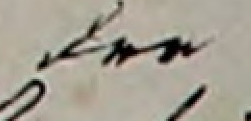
der
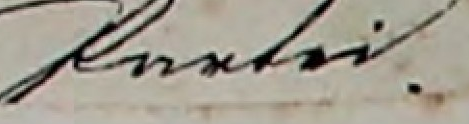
Partei
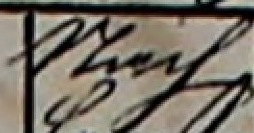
Noch
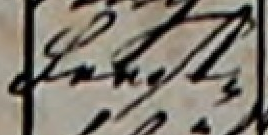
Forst„
